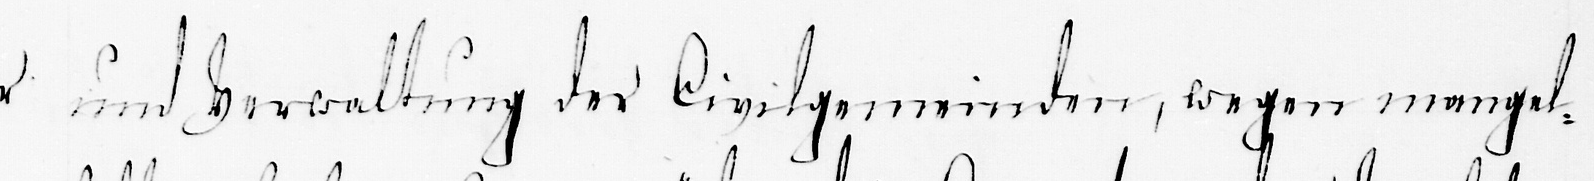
und Verwaltung der Civilgemeinden, wegen mangel¬
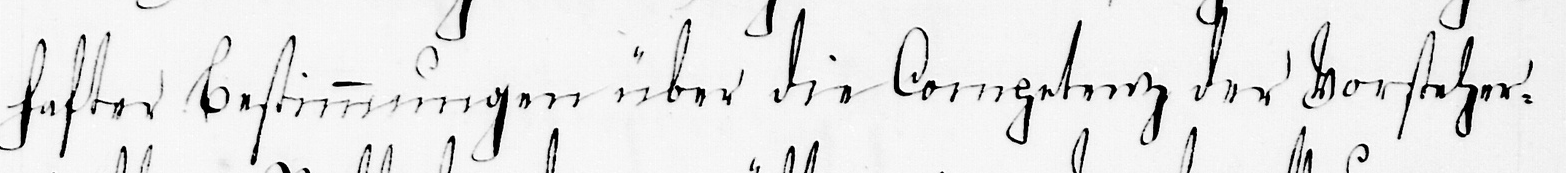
hafter Bestimmungen über die Competenz der Vorsteher¬
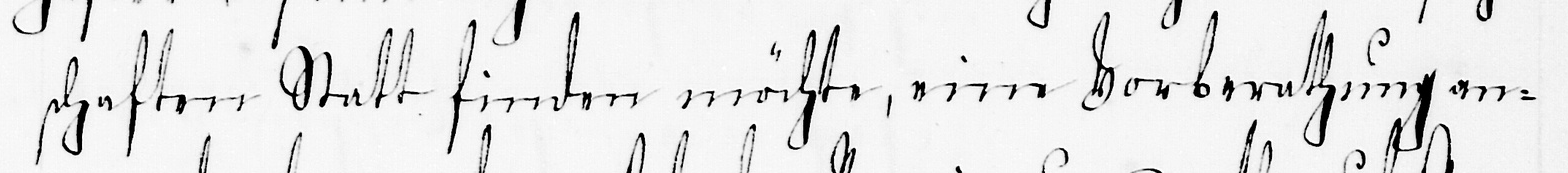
schaft Statt finden möchte, eine Vorberathung an¬
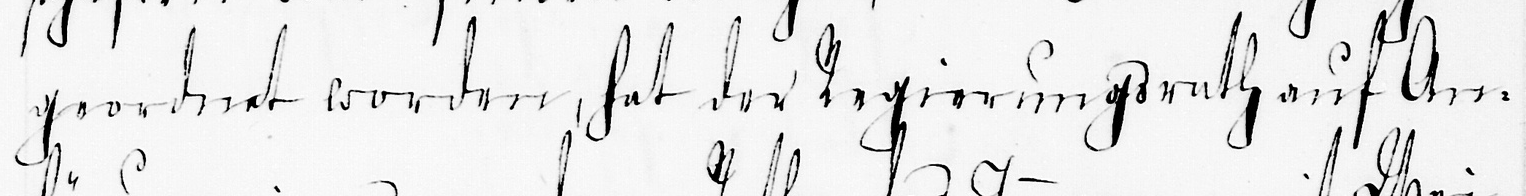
geordnet worden, hat der Regierungsrath auf An¬
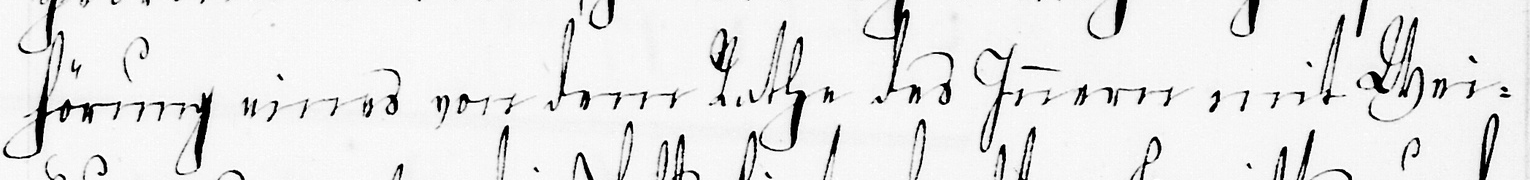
hörung eines von dem Rathe des Innern mit Weis¬
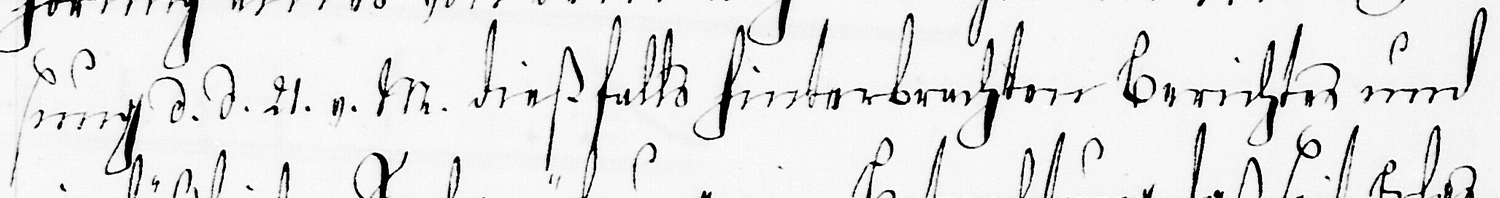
ung d. d. 21. v. M. dießfalls hinterbrachten Berichtes und
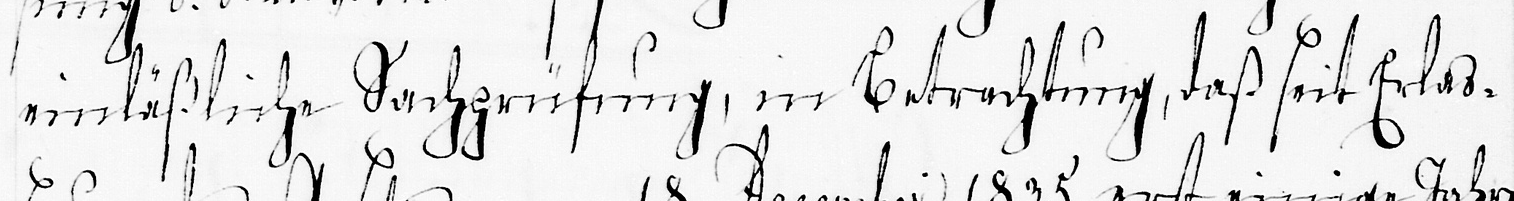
einläßliche Sachprüfung, in Betrachtung, daß seit Erla¬
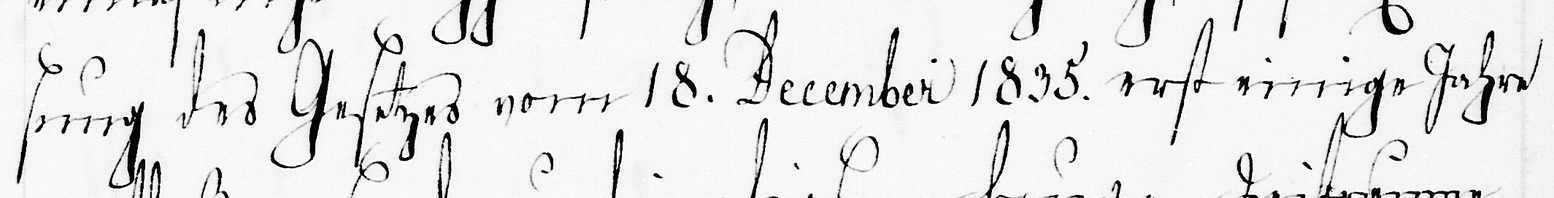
ßung des Gesetzes vom 18. December 1835. erst einige Jahre
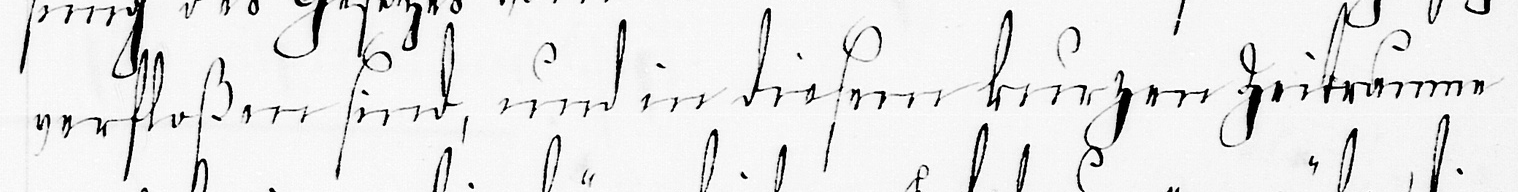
verfloßen sind, und in diesem kurzen Zeitraume
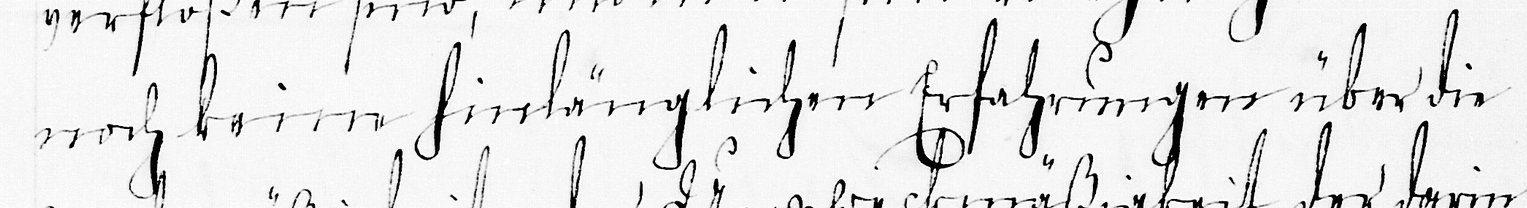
noch keine hinlänglichen Erfahrungen über die
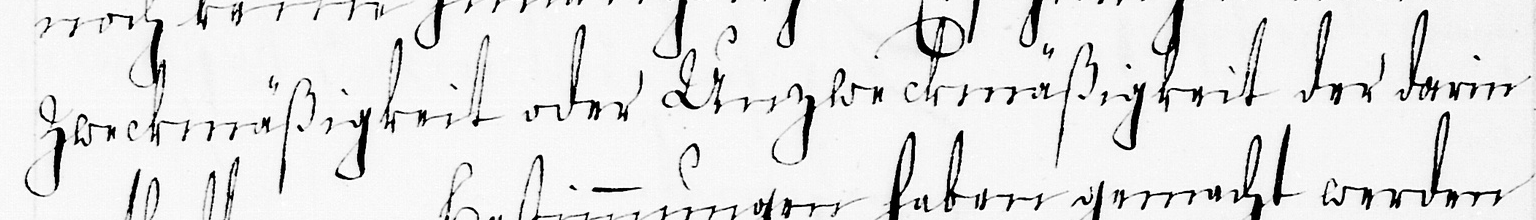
Zweckmäßigkeit oder Unzweckmäßigkeit der darin
